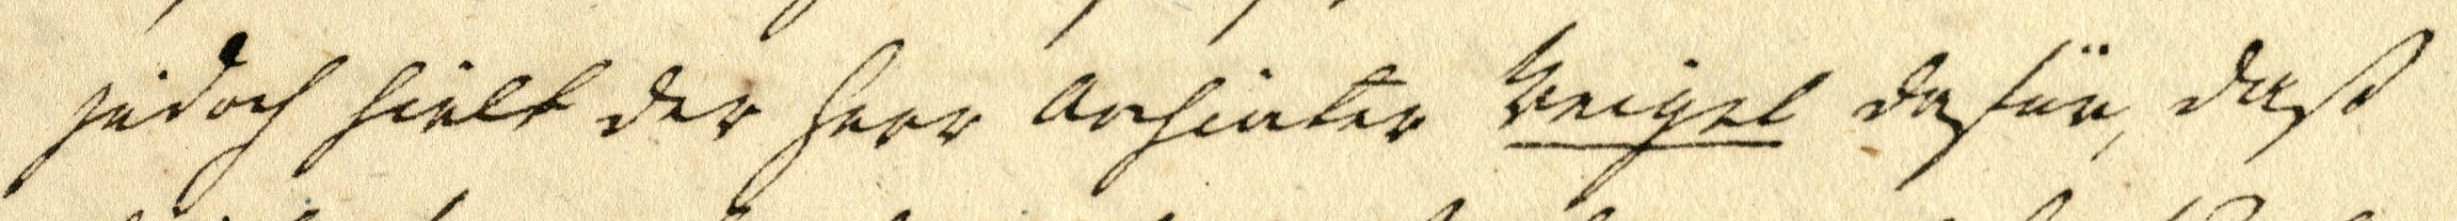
jedoch hielt der herr Archiater Weigel dafür, daß
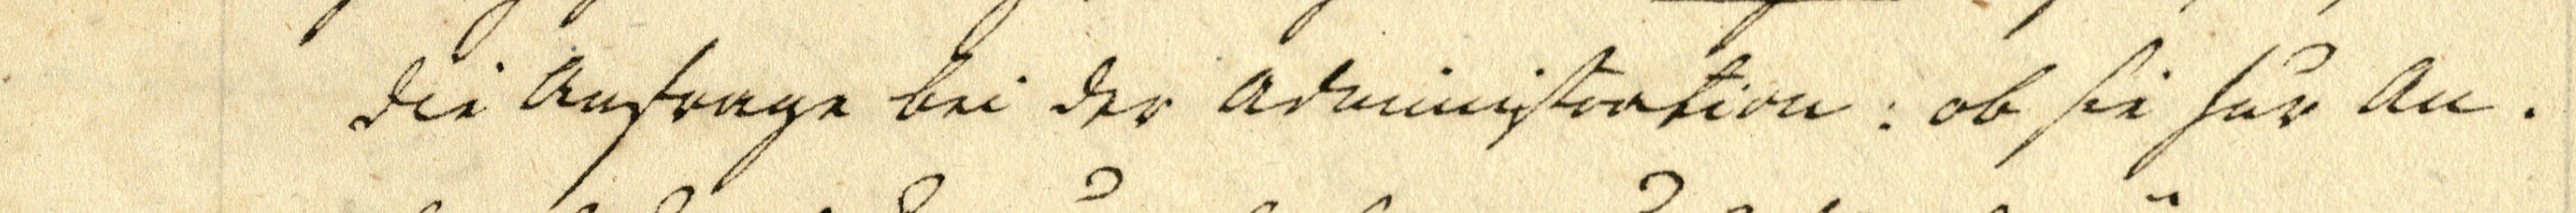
die Anfrage bei der Administration: ob sie für An¬
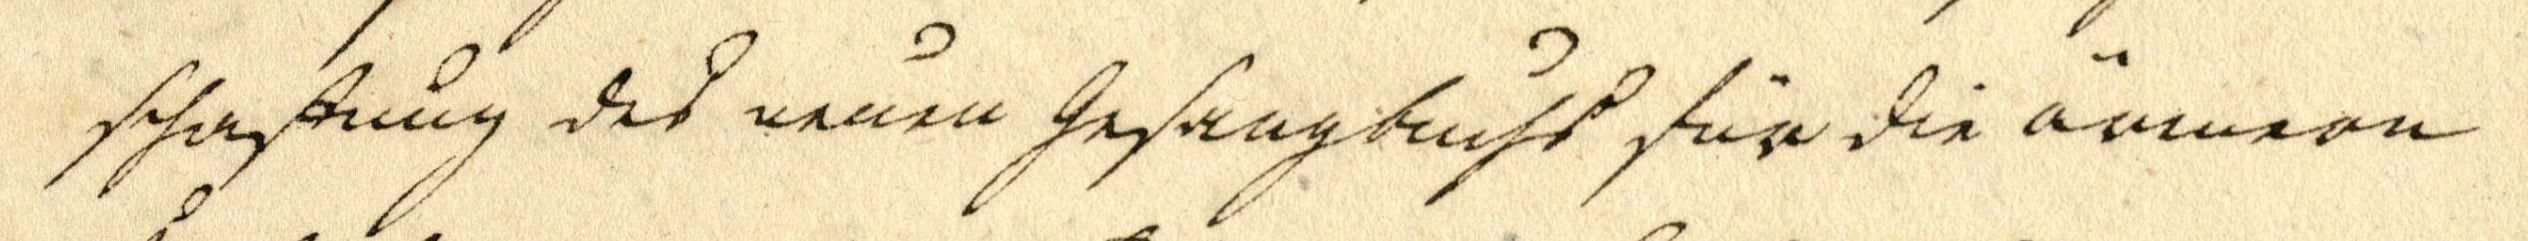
schafung des neuen Gesangbuchs für die ärmern
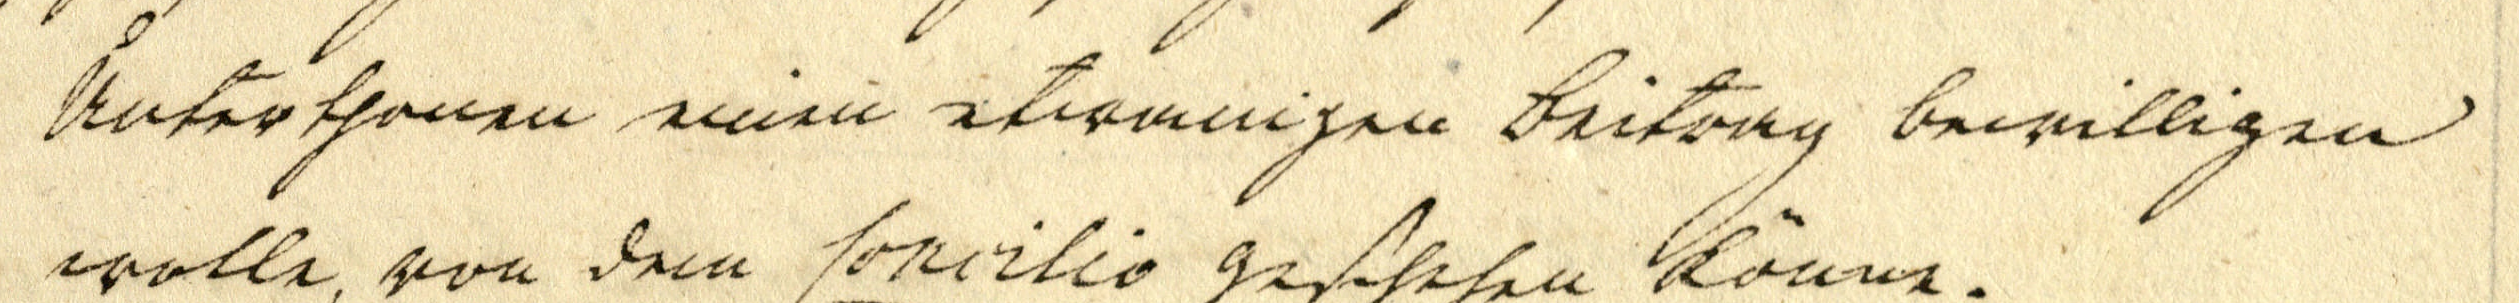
Unterthanen einen etwanigen Beitrag bewilligen
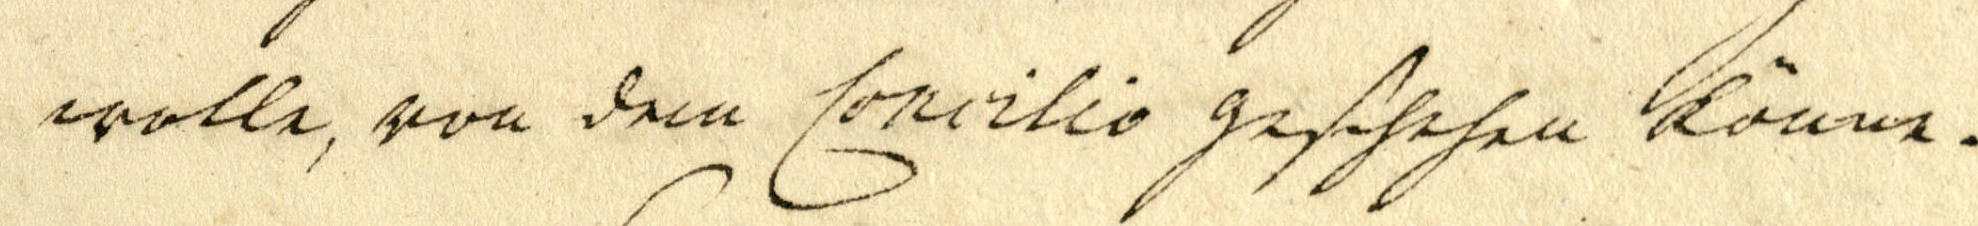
wolle, von dem Concilio geschehen könne.
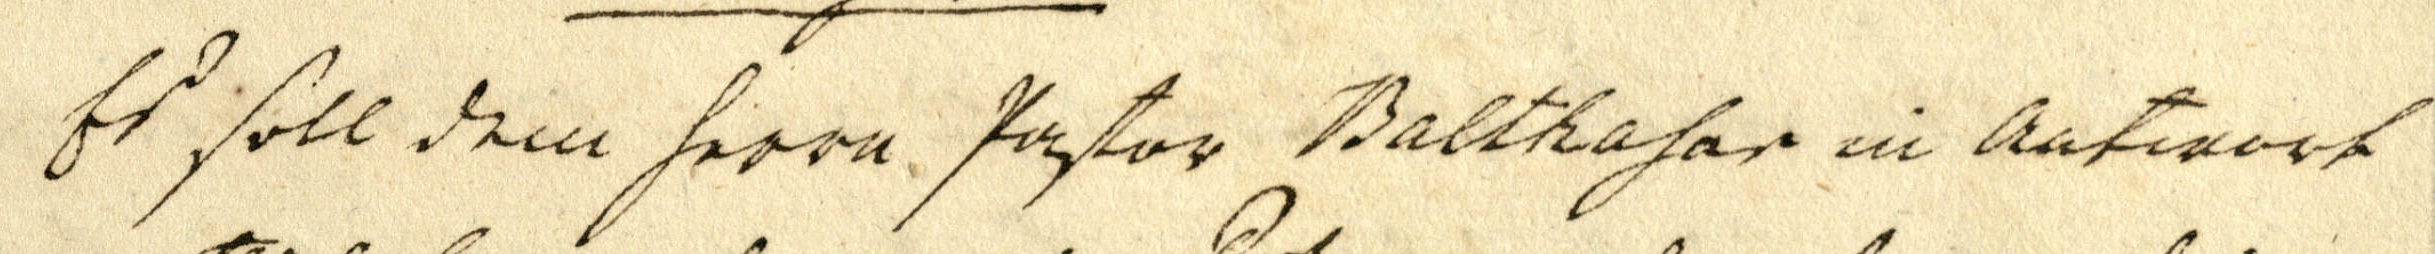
Es soll dem herrn Pastor Balthasar in Antwort
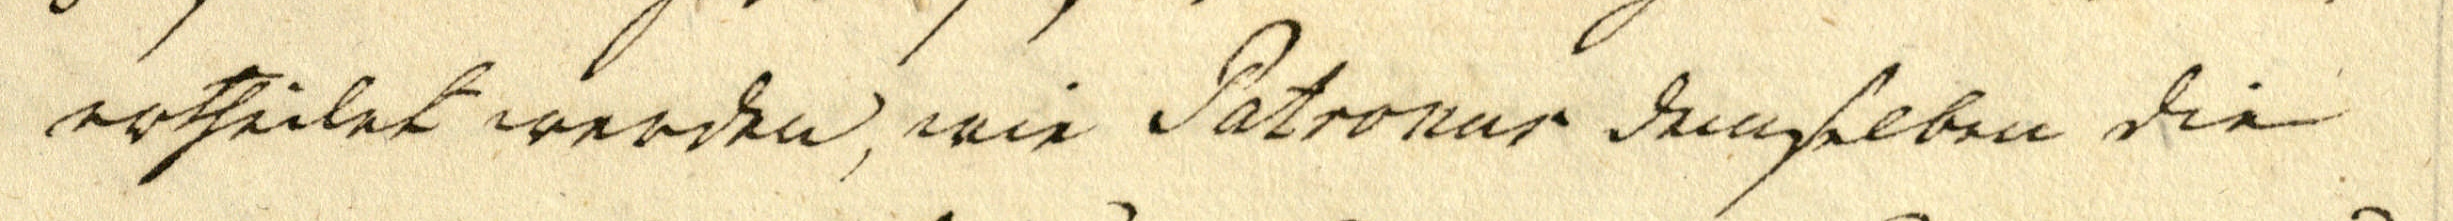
ertheilet werden, wie Patronus demselben die
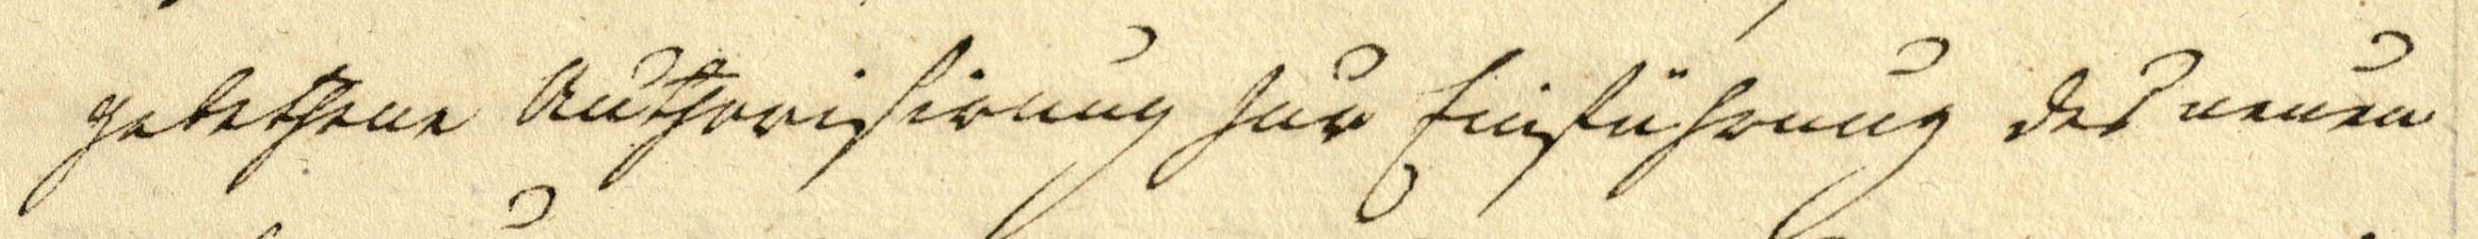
gebethene Authorisirung zur Einführung des neuen
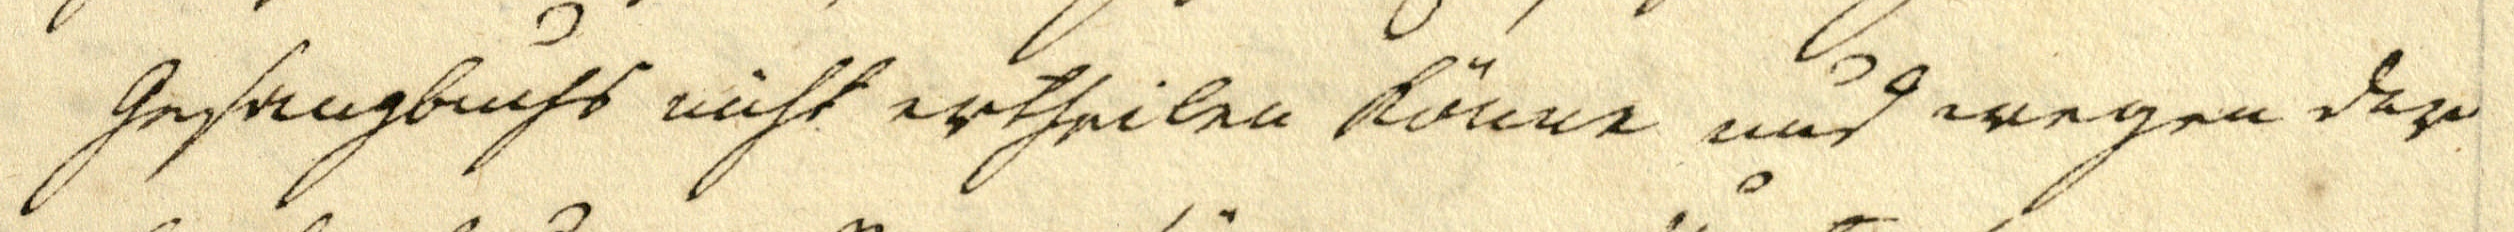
Gesangbuchs nicht ertheilen könne und wegen der
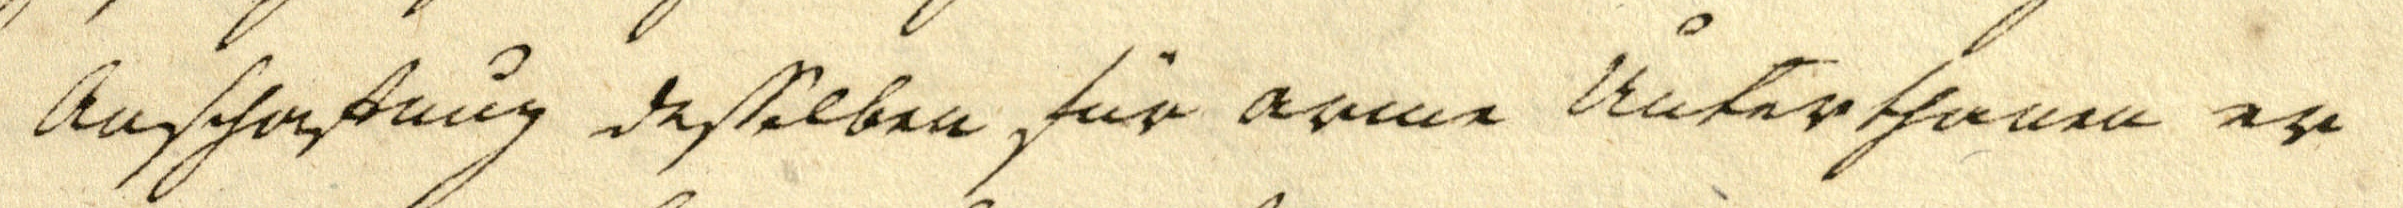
Anschafung desselben für arme Unterthanen er
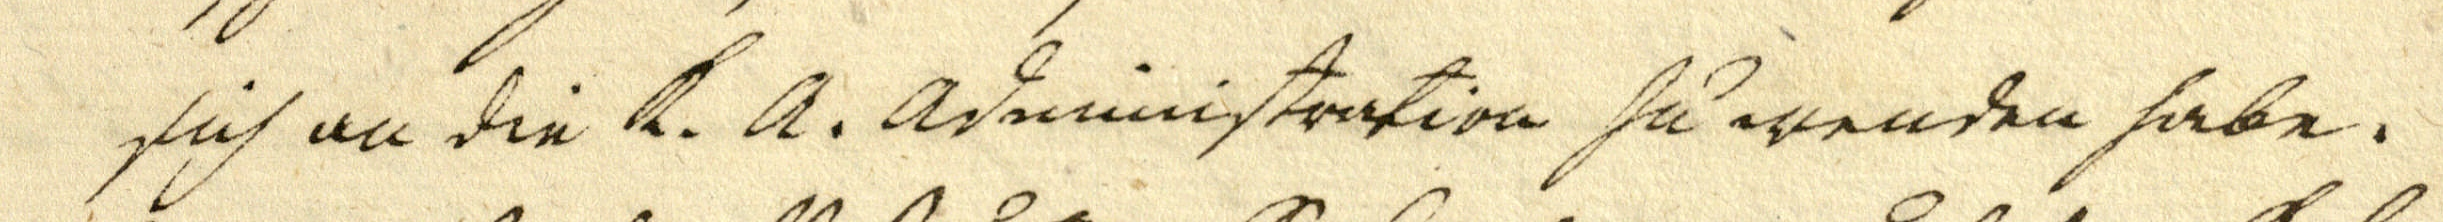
sich an die K. A. Administration zu wenden habe.
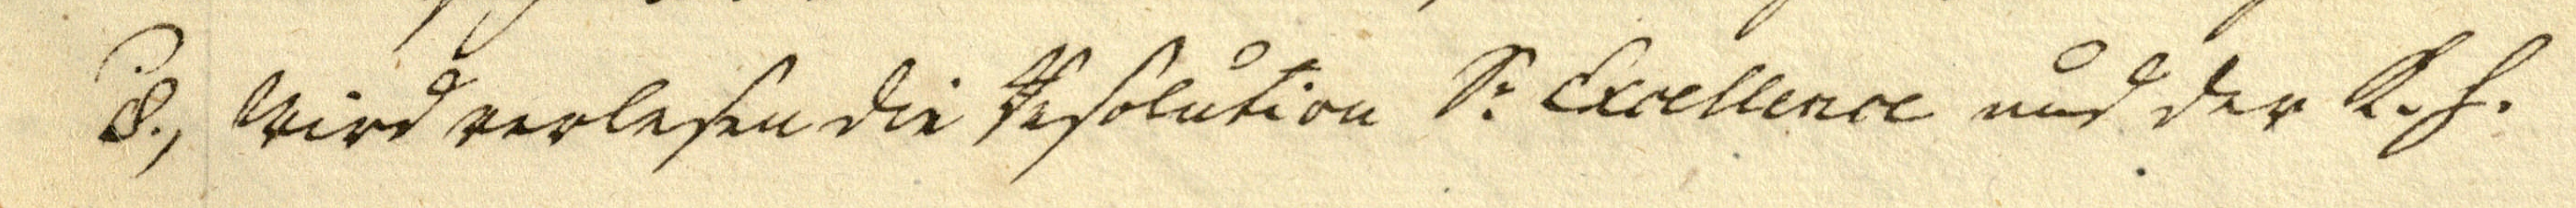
8. Wird verlesen die Resolution Sr. Excellence und der K. h.
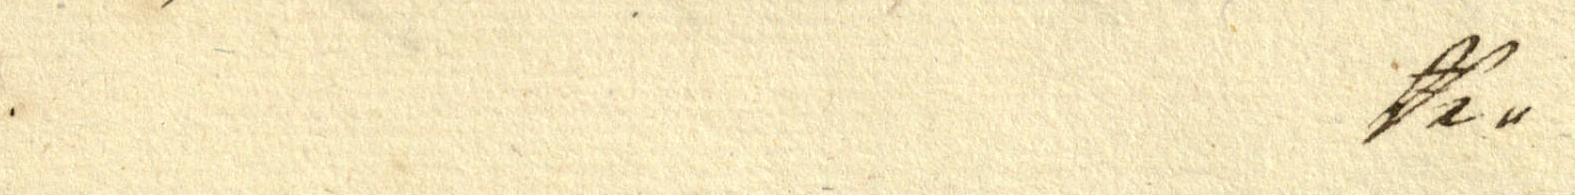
Re.
